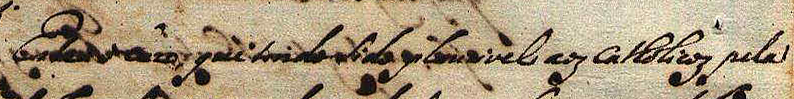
E deu o caso, que tendo sido plauzivel aoz catholicoz pela
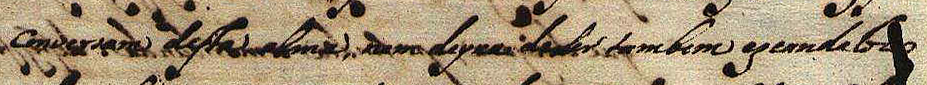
conversam desta alma, nam deyxa de ser tambem ezcandalozo
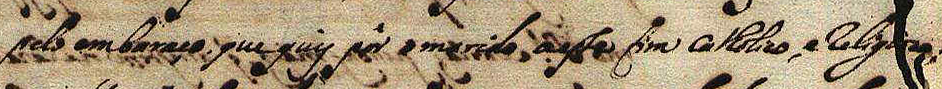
pelo embaraço, que quis pôr o marido a este fim catholico, e Religiozo
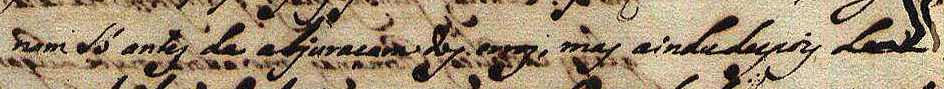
nam só antes da abjuraçam dos erroz, mas ainda despois de
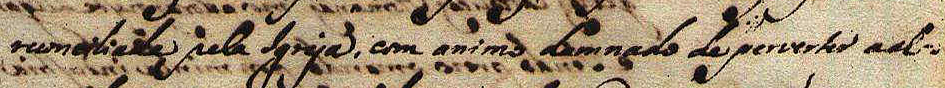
reconciliada pela Igreja, com animo damnado de perveter a al
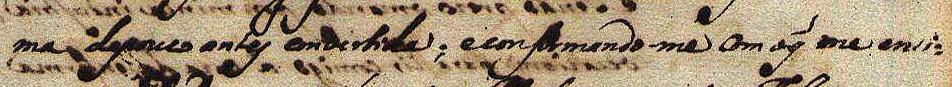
ma de pouco antes convertida; e conformando-me com o q̄ me ensi
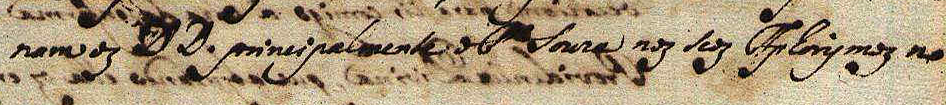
nam oz D D. principalmente o P.e Souza noz seoz Aphorismoz no
